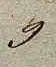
9
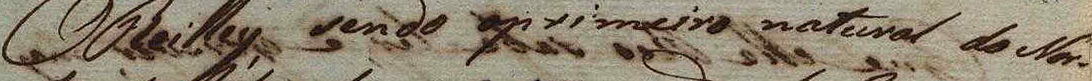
OReilley, sendo o primeiro natural do Nor
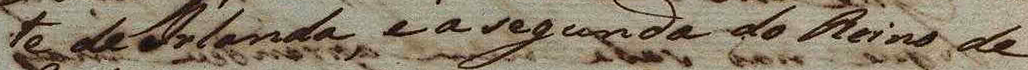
te de Irlanda, e a segunda do Reino de
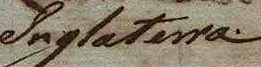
Inglaterra.
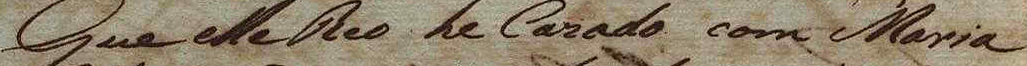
Que elle Reo he Cazado com Maria
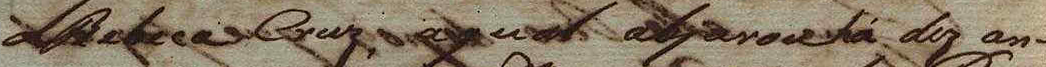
Rebeca Cruz, a qual abjurou há dez an
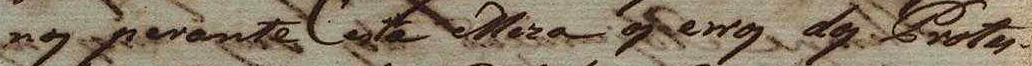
nos perante esta Meza os erros dos Protes
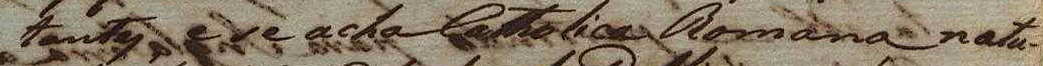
tantes, e se acha Catholica Romana, natu
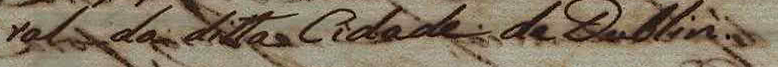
ral da ditta Cidade de Dublin.
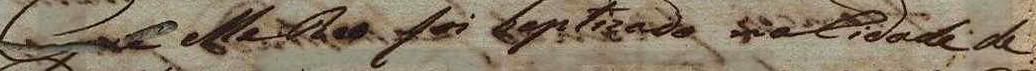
Que elle Reo foi baptizado na Cidade de
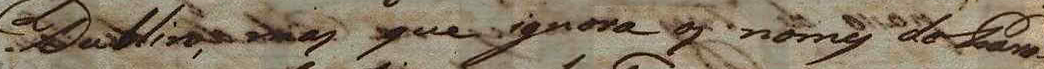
Dublin, mas que ignora os nomes do Paro
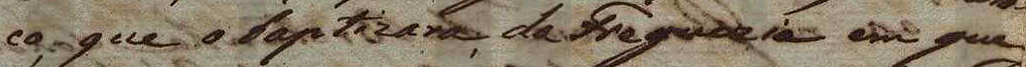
co, que o baptizara, da Freguezia em que
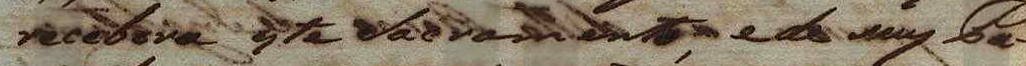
recebera este Sacramento, e de seus Pa
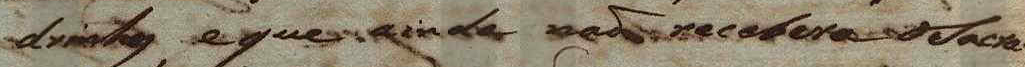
drinhos, e que ainda naõ recebera o Sacra
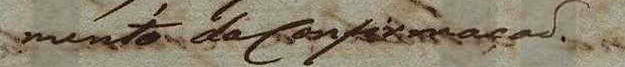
mento da Confirmaçaõ.
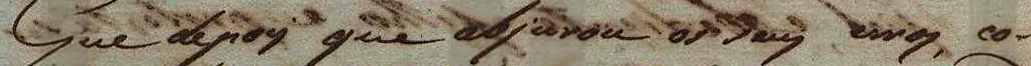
Que depois que abjurou os seus erros, co
